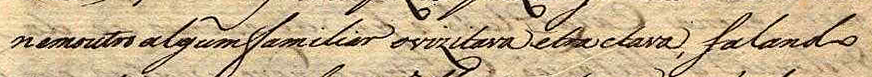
nem outro algum familiar o vizitava e tractava, falando
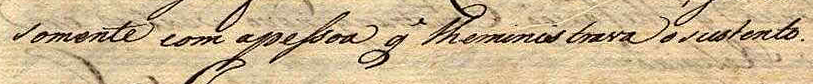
somente com a pessoa q̄ lhe ministrava o sustento.
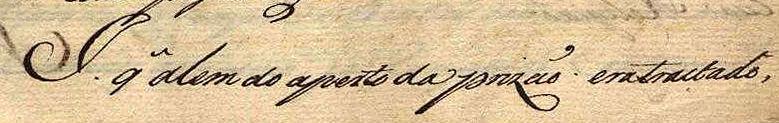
I. q̄ alem do aperto da prizaõ era tractado,
